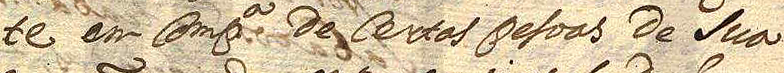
te em comp.a de certas pesoas de sua
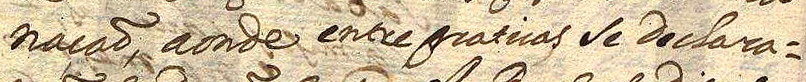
naçaõ, aonde entre praticas se declara
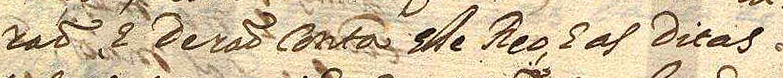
raõ, E deraõ conta Elle Reo, E as ditas
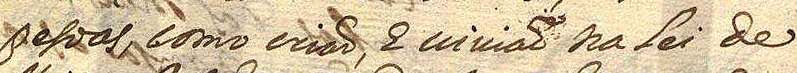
pesoas, como criaõ, E uiuiaõ na lei de
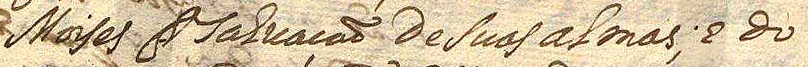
Moises pa saluaçaõ de suas almas, E do
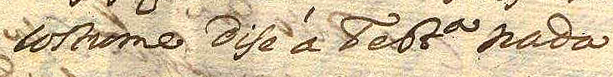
costume dise a Testa nada
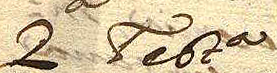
2a Testa
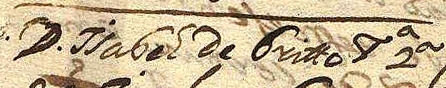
D. Isabel de britto Ta 2a
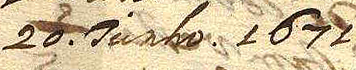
20. Iunho. 1671
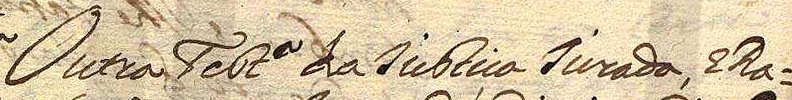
Outra testa da Iustiça Iurada, E Ra
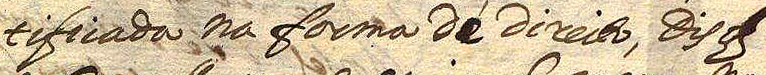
tificada na forma de direito, Dis q̄
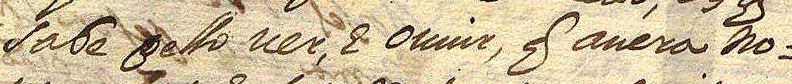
sabe pello uer, E ouuir, q̄ auera no
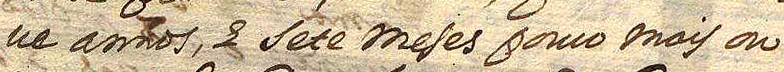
ue annos, E sete meses pouco mais ou
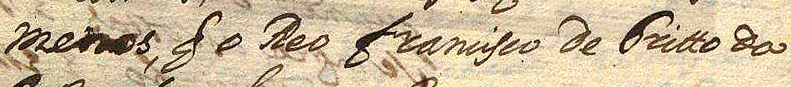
menos, q̄ o Reo francisco de britto da
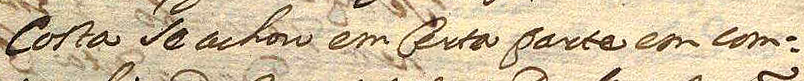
Costa se achou em Certa parte em com
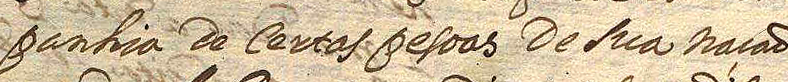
panhia de Certas pesoas de sua naçaõ
